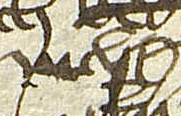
nicht
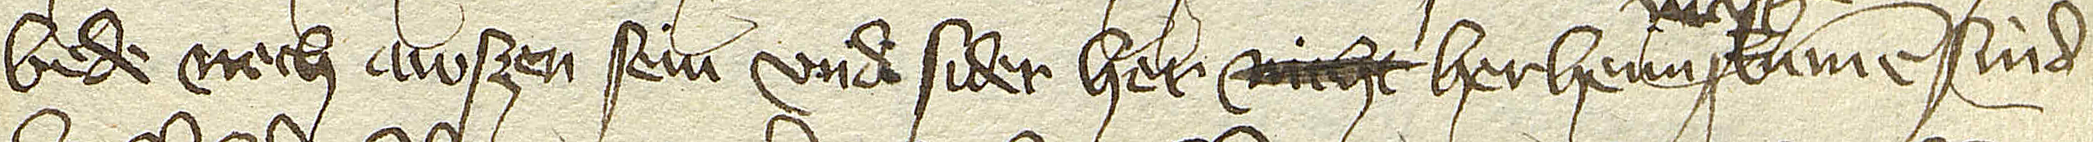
bede noch awſʒen ſein vnd ſider her nicht herheim kume* ſind
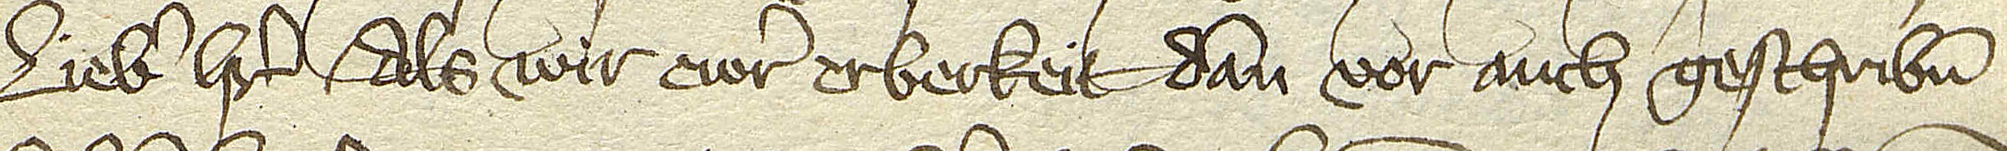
Lieb* hr* / Als wir ewr* erberkeit dan* vor auch geſchribn*
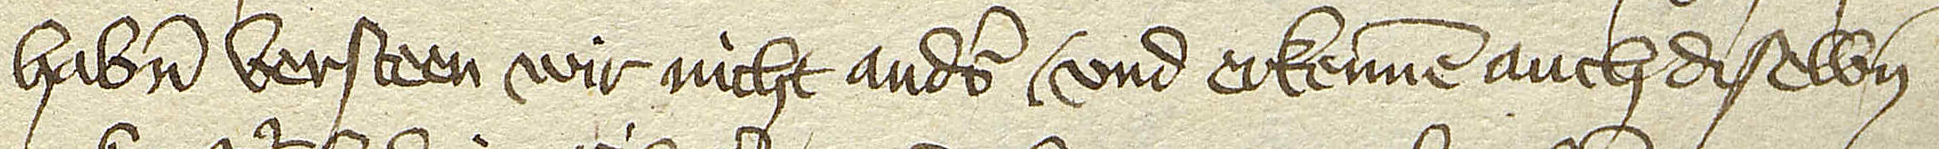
habn* verſteen wir nicht ands* / vnd erkenne* auch diſelbn*
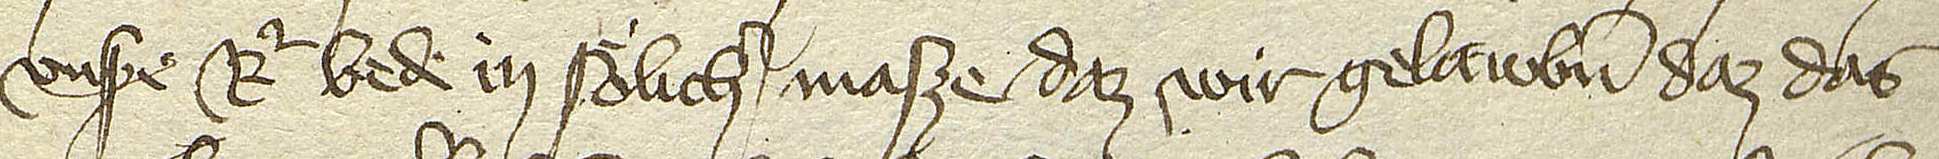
vnſ*e B* bede in ſölich* maſʒe / daʒ wir gelawbn* daʒ das
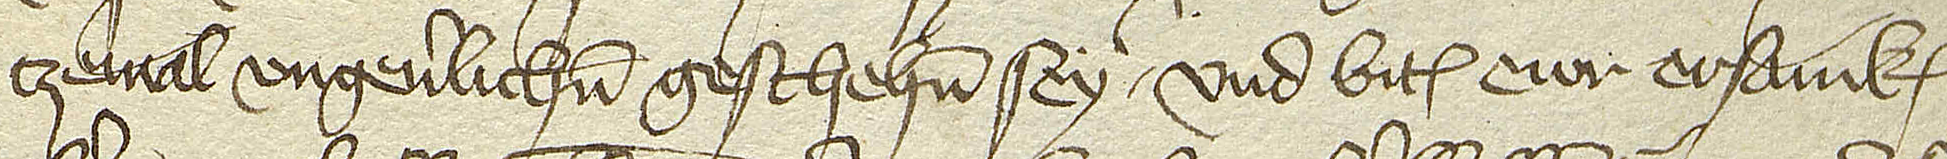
cʒemal vngeu*lichn* geſchehn* ſey / vnd bit* ewr erſamk*
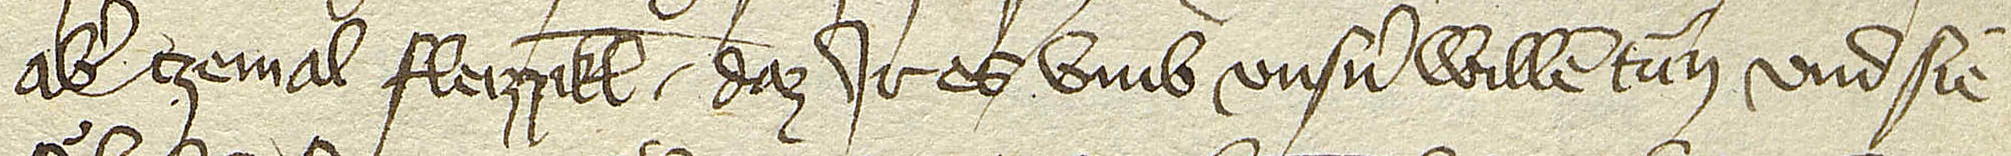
ab* cʒemal fleiʒʒikl* / daʒ Ir es vmb vnſn* wille* tün vnd ſie
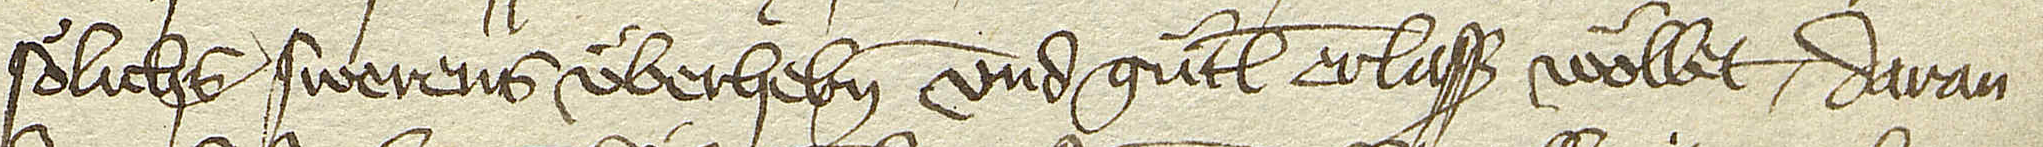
ſölichs* ſwerens v̈berhebn* vnd gütl* erlaſſ* wöllet / Daran
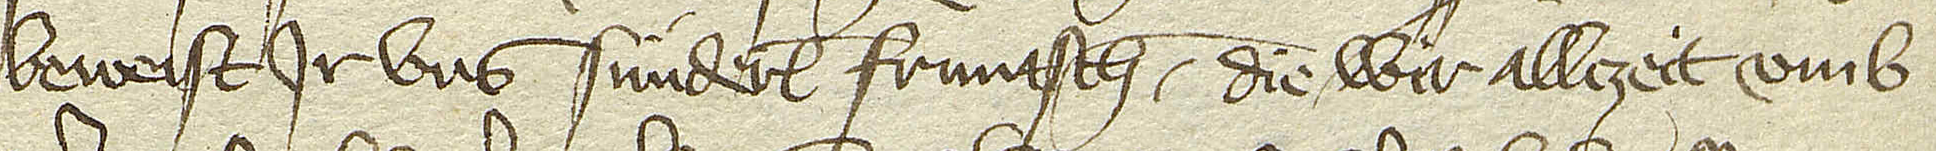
beweiſt Ir vns ſünderl* fruntſch* / die wir allcʒeit vmb
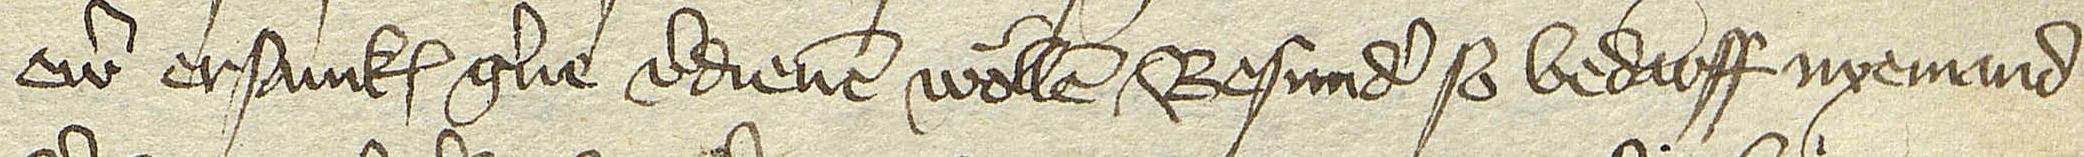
ew* erſamk* g*ne v*diene* wölle* / Beſund* ſo bedarff nyemand
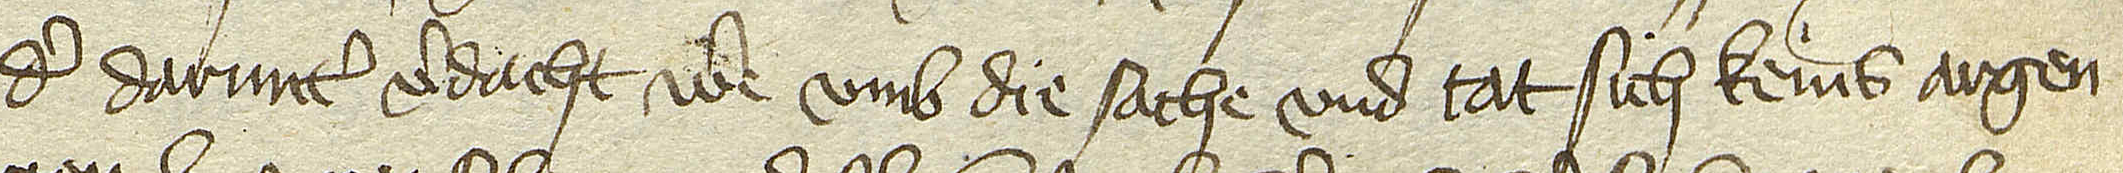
d* darunt* v*dacht w*e vmb die ſache vnd tat ſich keins argen
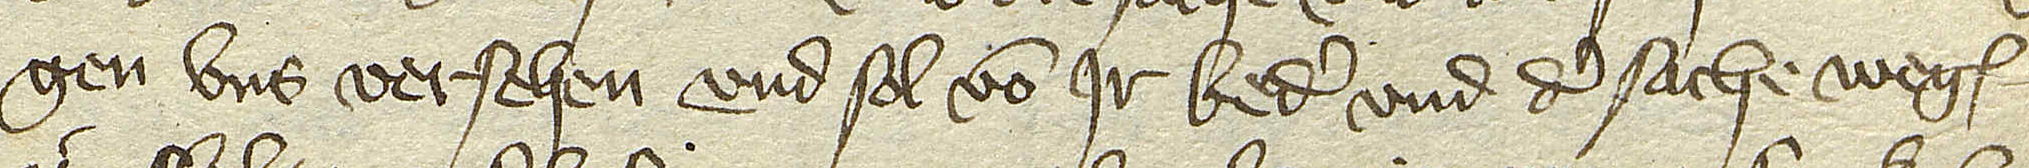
gen vns verſehen vnd ſol vo* Ir bed* vnd d* ſache weg*
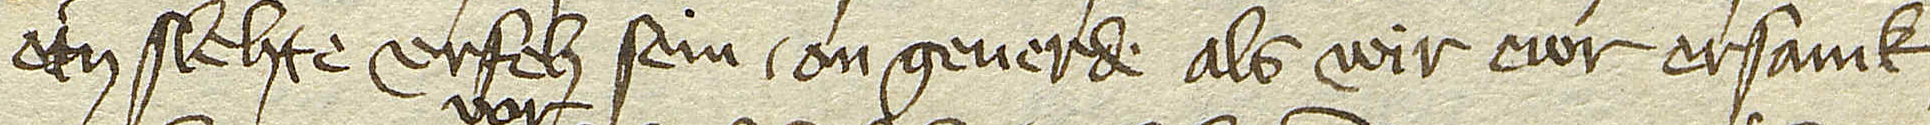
ein ſlehte vrfeh ſein / on geuerde als wir ewr erſamk*
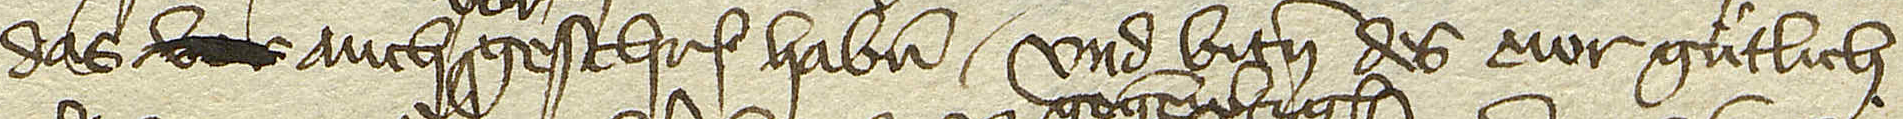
das vor auch geſchr* habn* / vnd bitn* des ewr gütlich
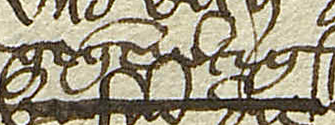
gegen*tig*
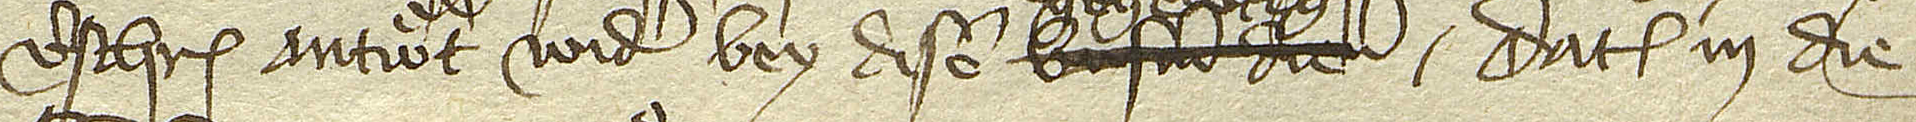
v*ſchr* antwt* wid* bey diſe* vnſm* die* / Dat* in die
